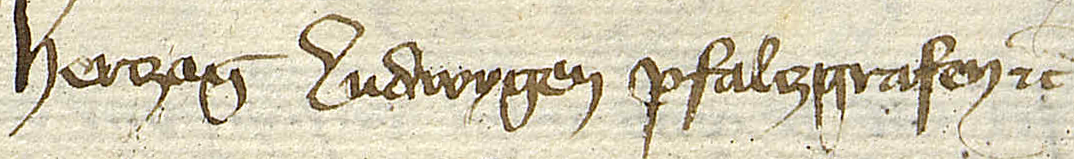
hercʒog Ludwygen Pfalcʒgrafen ec*
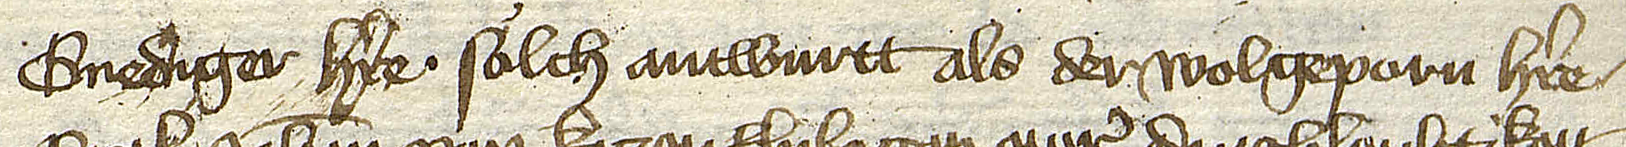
Gnediger h*re . ſölch antwurtt als der wolgeporn h*re /
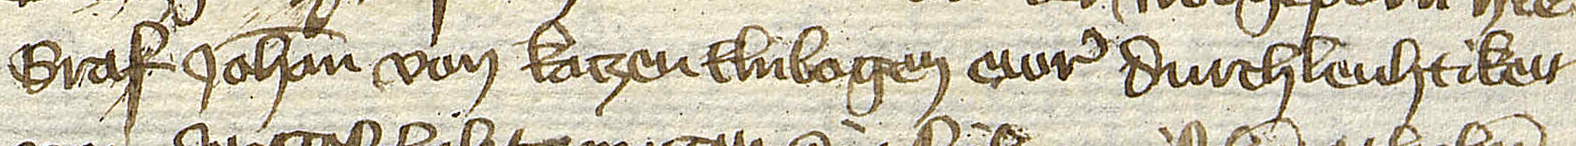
Graf Iohan* von kacʒenElnbogen ewr* Durchleuhtikeit
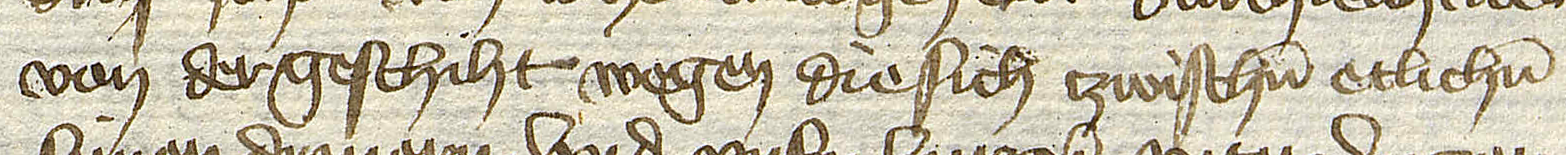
von der geſchiht wegen die ſich cʒwiſchn* etlichn*
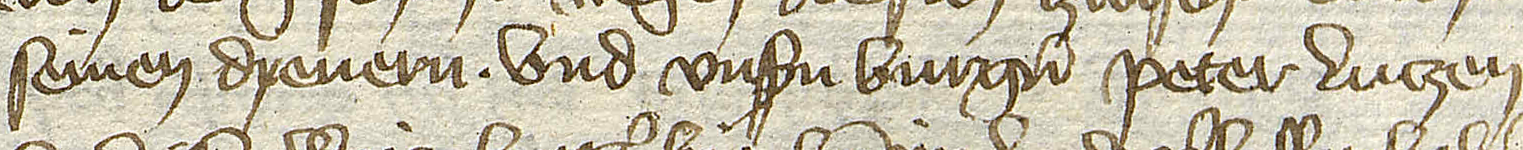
ſeinen dyenern . vnd vnſ*n burgn* Peter Lucʒen
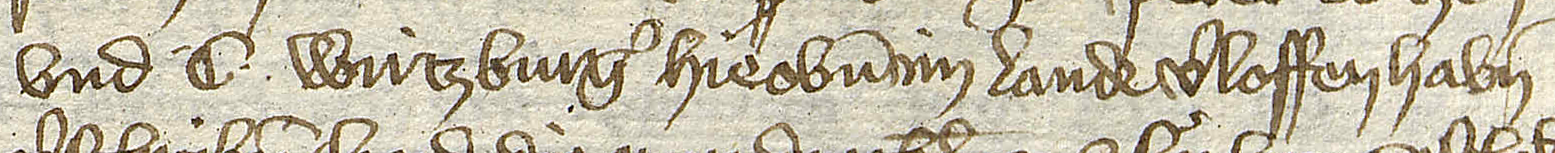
vnd C . Wircʒburg* hie obn* im Lande v*loffen habn*
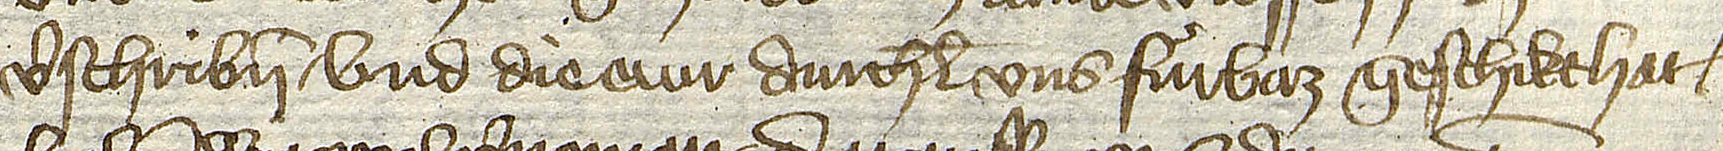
v*ſchribn* / vnd die ewr durchl* vns fürbaʒ geſchikt hat /
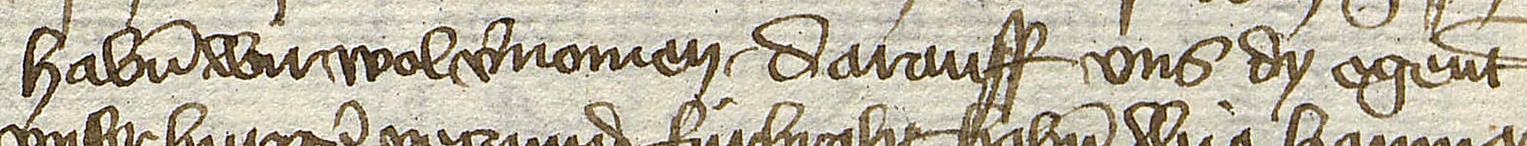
habn* wir wol v*nomen / Darauff vns dy egent*
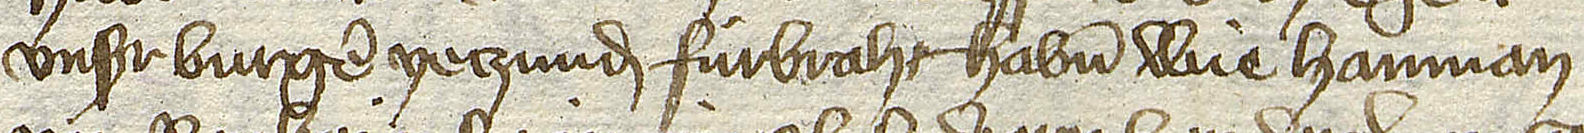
vnſ*r burge* yecʒund* fürbraht habn* wie hanman
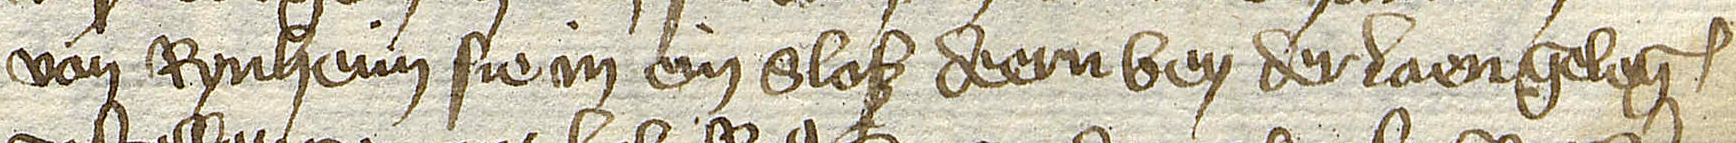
von Rynheim ſie in ein Sloſʒ deeren bey der Laen geleg*
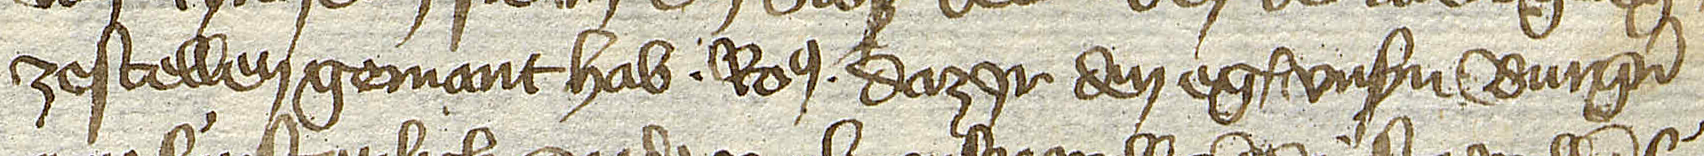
cʒeſtellen gemant hab . Ro* . daʒ Ir den eg* vnſ*n Burgn*
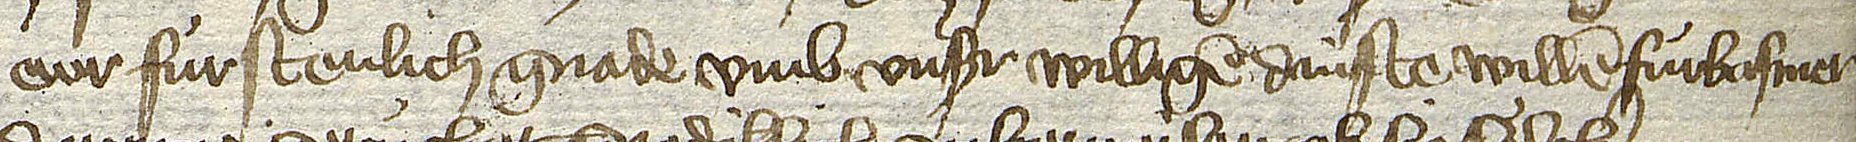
ewr fürſtenlich gnade vmb vnſ*r willige* dinſte wille* fürbaſmer
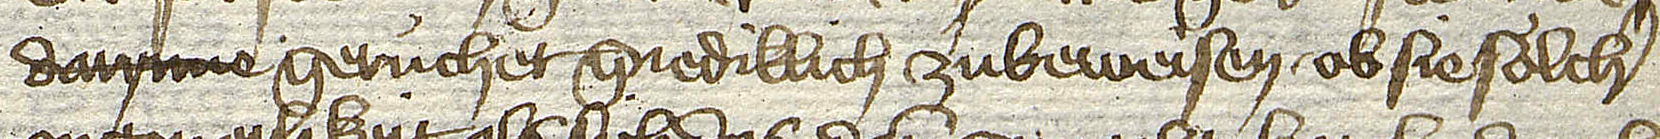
darynne gerüchet gnediklich cʒubeweiſen / ob ſie ſölch*
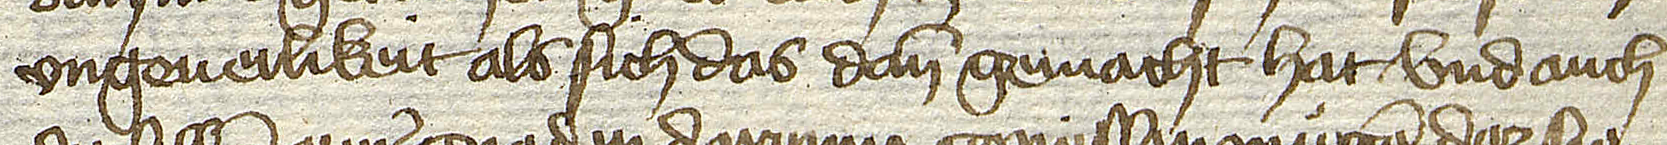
vngeuerlikeit als ſich das dan* gemacht hat / vnd auch
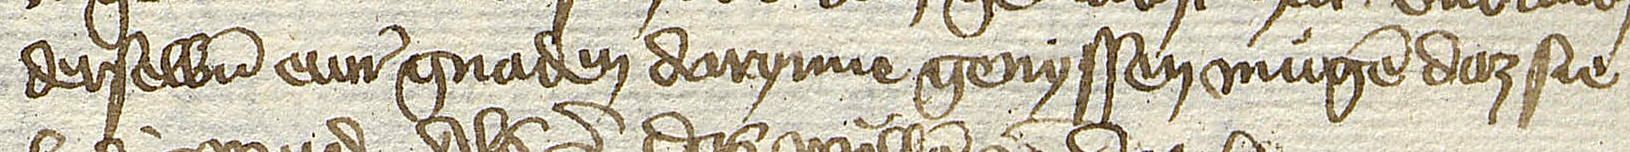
derſelbn* ewr* gnaden darynne genyſſen müge* daʒ ſie
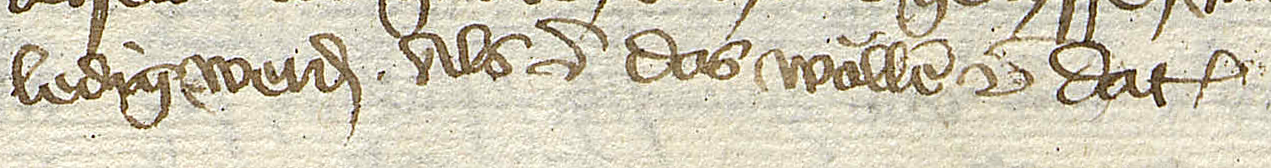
ledig werd* . Als ec* das wölle* ec* Dat*
